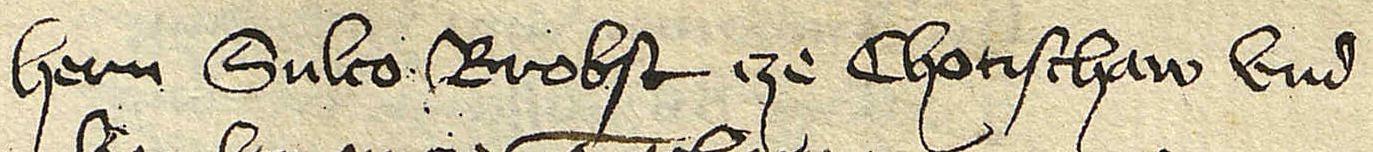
hern Sulco Brobſt cʒe Chotiſchaw vnd
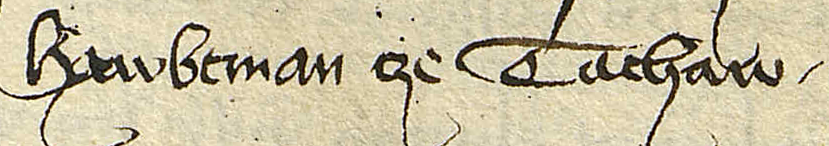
hawbtman cʒe Tachaw /
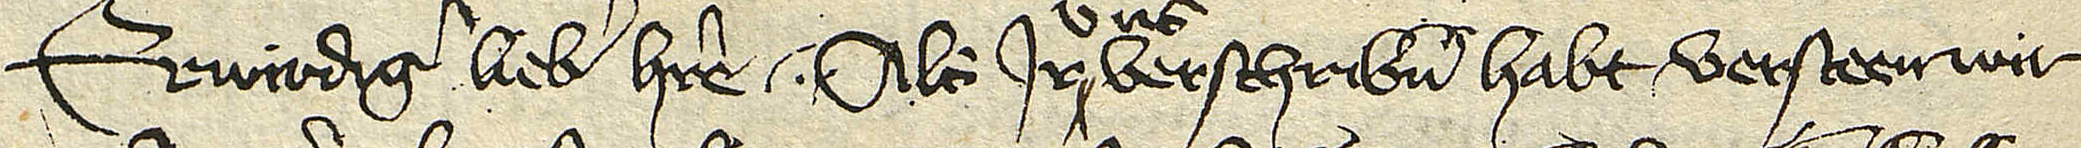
Erwirdig* lieb* hr*e / . Als Ir verſchribn* habt / verſteen wir
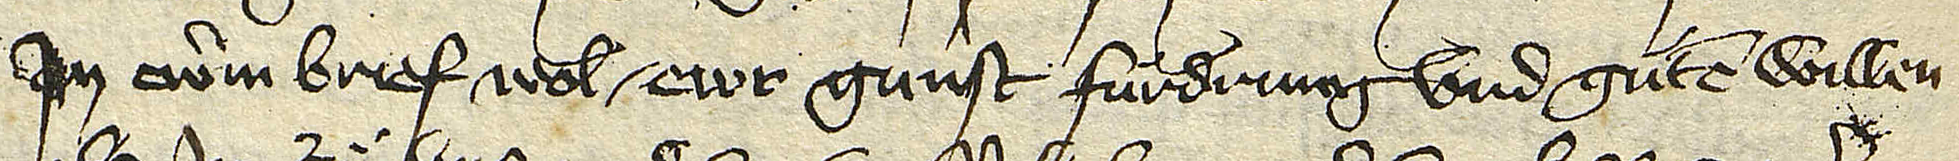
In ew*m brief wol / ewr gunſt fürdrung vnd güte* willen
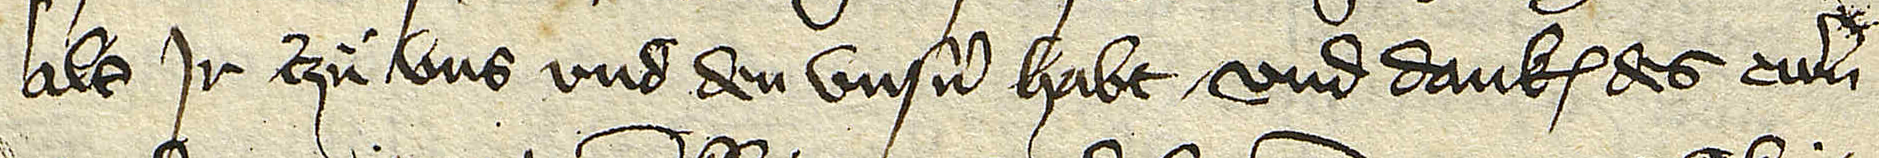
als Ir cʒü vns vnd den vnſn* habt / vnd dank* des ew*n
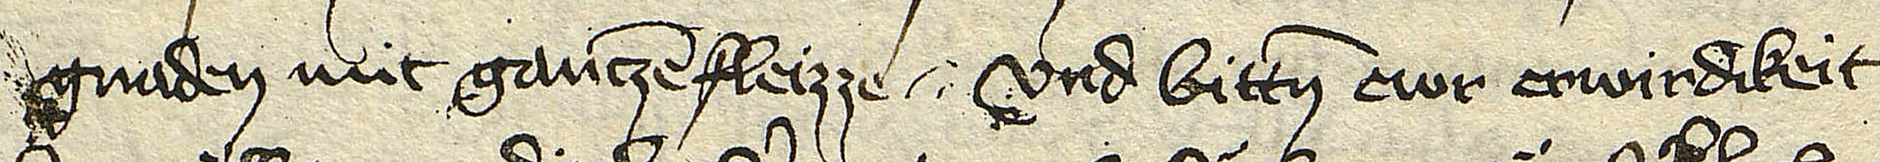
gnaden mit gancʒe* fleiʒʒe / vnd bittn* ewr erwirdikeit
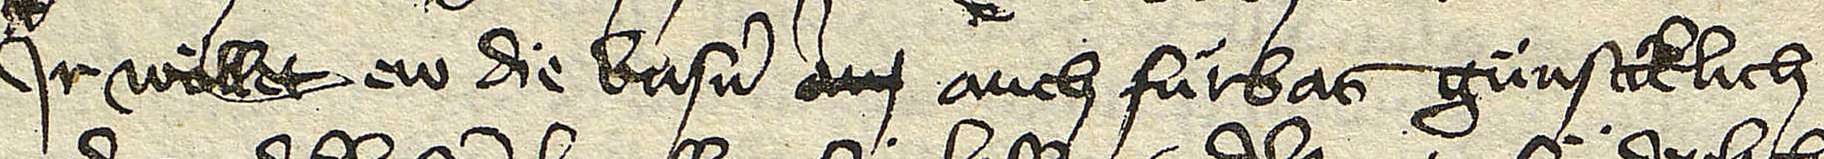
Ir wöllet ew die vnſn* auf auch fürbas günſtiklich
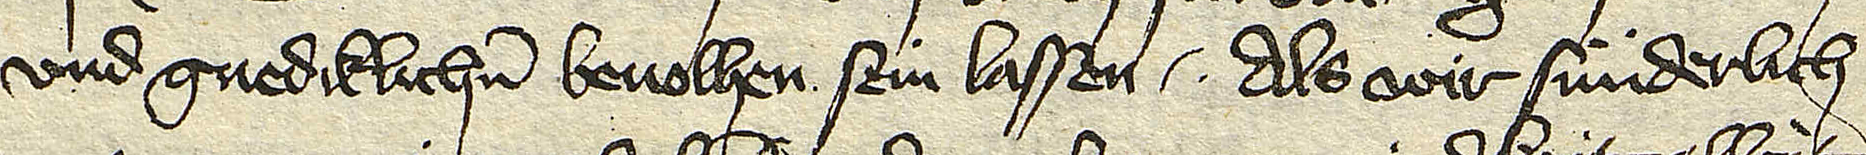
vnd gnediklichn* beuolhen ſein laſſen / . Als wir ſünderlich
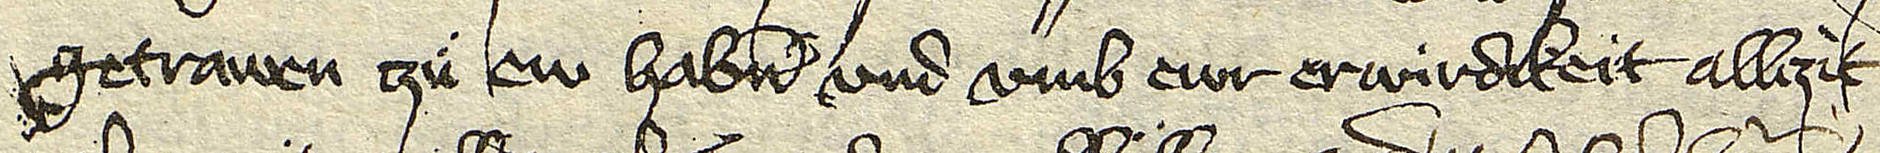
getrawen cʒü ew habn* vnd vmb ewr erwirdikeit allcʒit
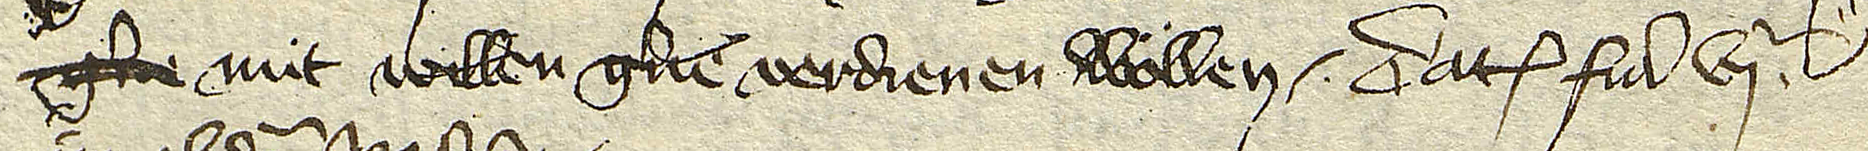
g*ne mit willen g*ne verdienen wöllen / . Dat* fia* vi* .
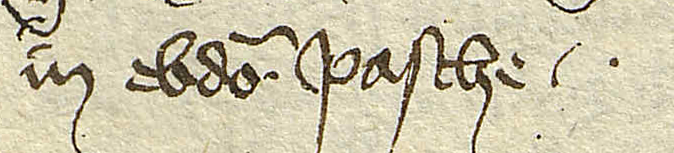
in ebdo* Paſche / .
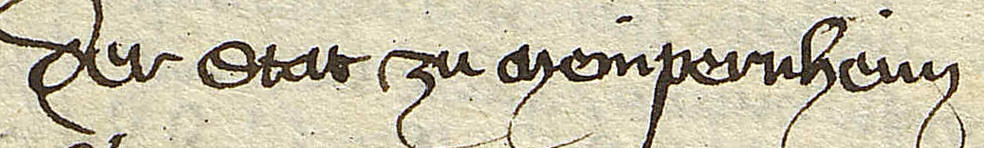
Der Stat cʒu Meinpernheim
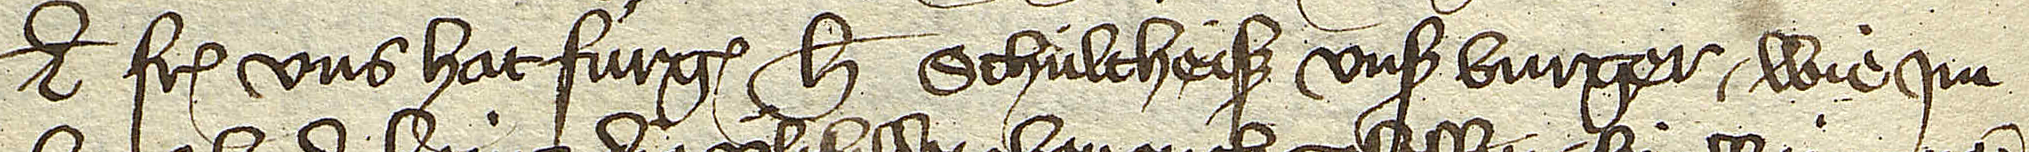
L* fr* vns hat fürg* H* Schultheiſʒ vnſ* burger / wie Im
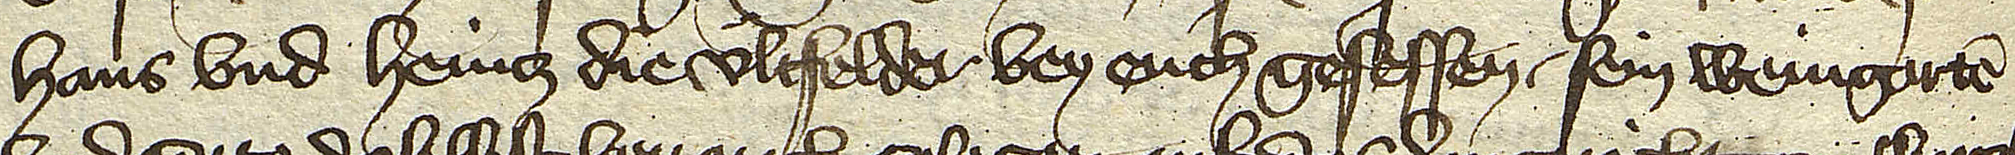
hans vnd heincʒ die v̈ltfelder bey euch geſeſſen / ſein weingarte*
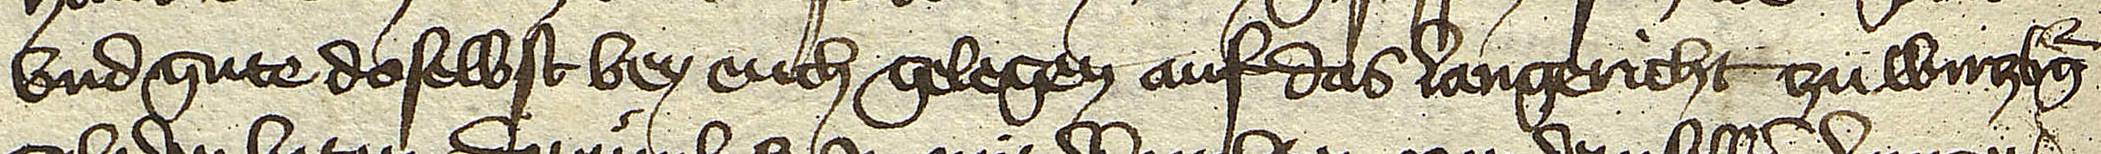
vnd gute doſelbſt bey euch gelegen auf das langericht cʒu wircʒb*g
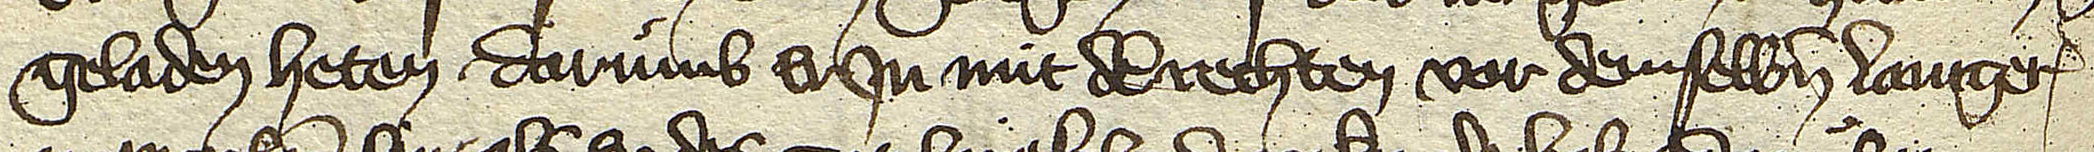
geladen heten / darümb Er In mit de* rechten vor demſelbn* lantger*
